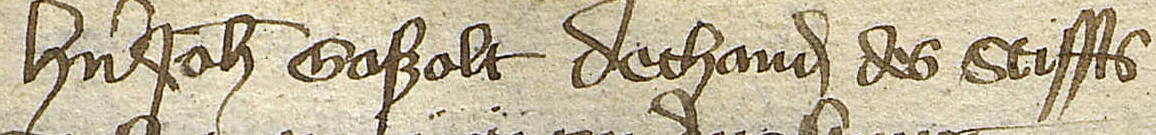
Hn* Ioh* Gaſʒolt Dechand* des Stiffts
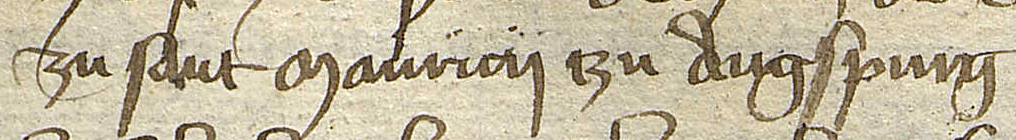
cʒu ſant Mauricii cʒu Augſpurg
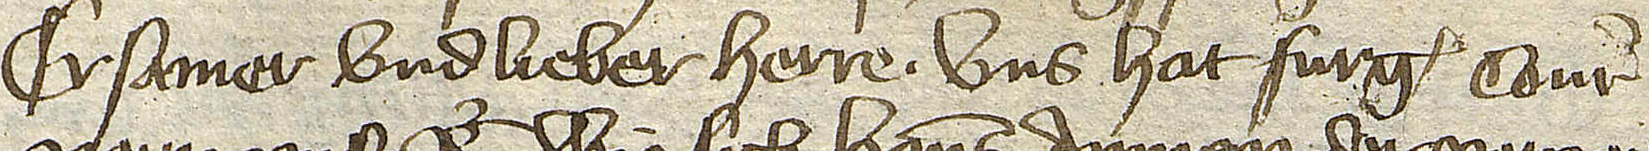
Erſamer vnd lieber herre . Vns hat furg* Conr*
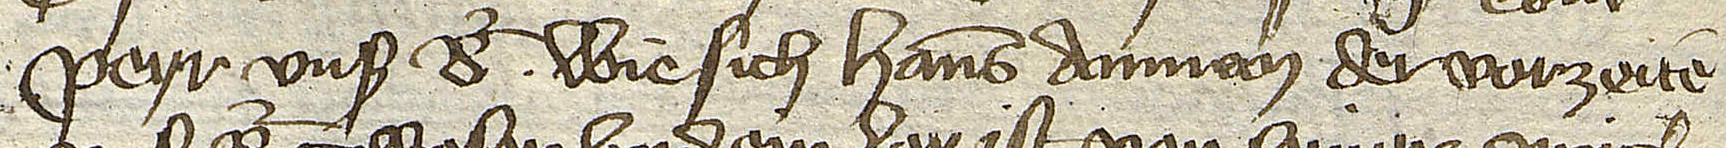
Peyr vnſ* B* . wie ſich hans* Amman der vorʒeite*
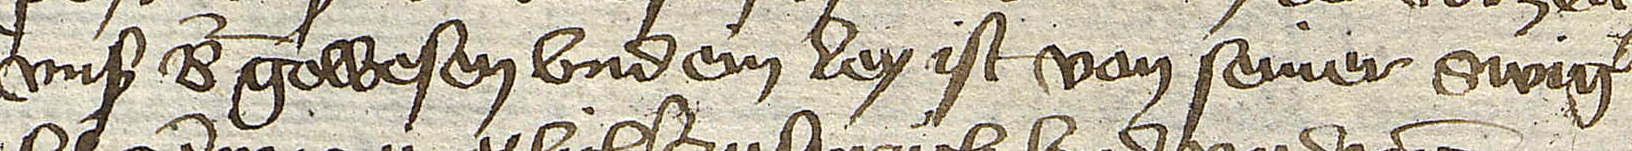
vnſ* B* geweſen vnd ein ley iſt von ſeiner Swig*
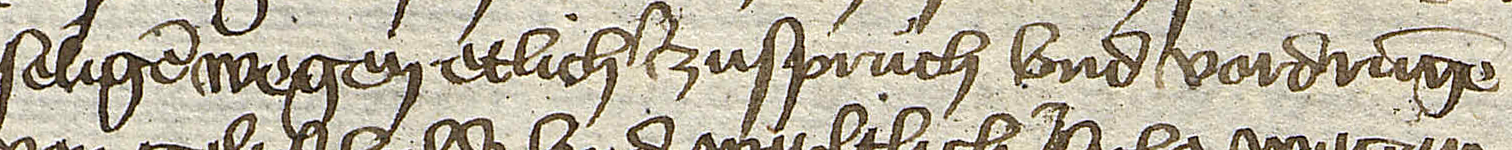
ſelige* wegen etlich* cʒuſprüch vnd vordruge*
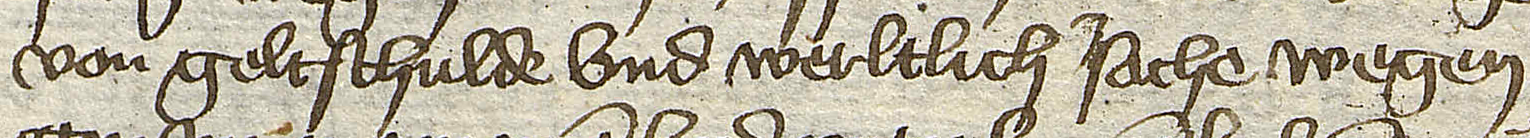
von geltſchulde vnd werltlich* ſache wegen
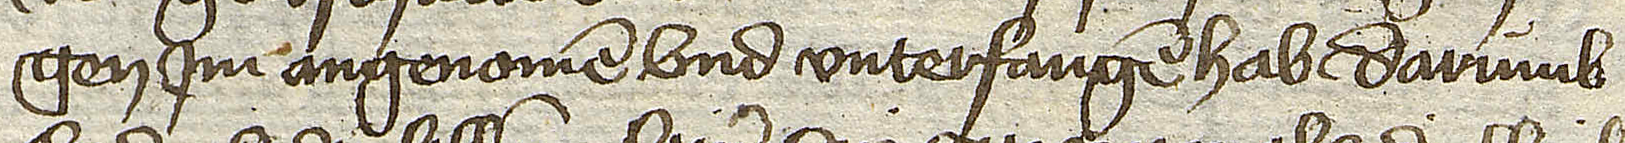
gen Im angenome* vnd vnterfange* hab / Darümb
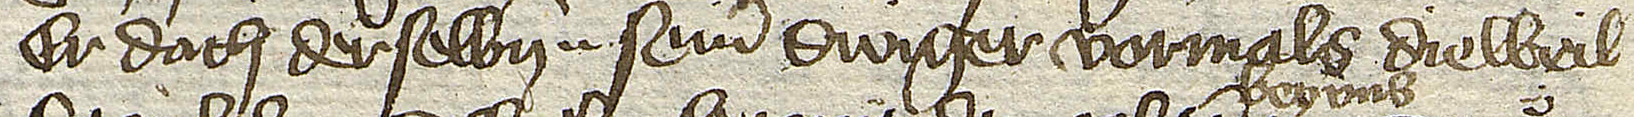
Er doch derſelbn* ~ ſeine* Swiger vormals dieweil
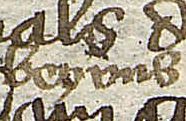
bey vns
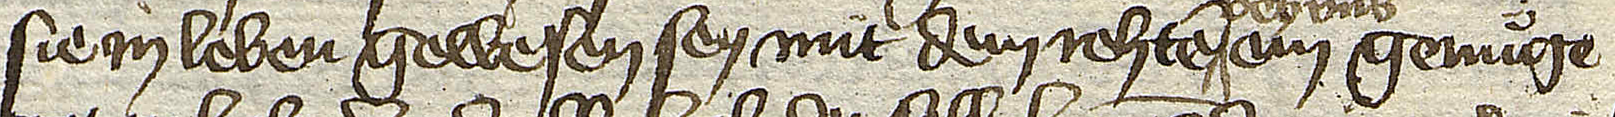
ſie in leben geweſen ſey mit dem rehte* ein genüge
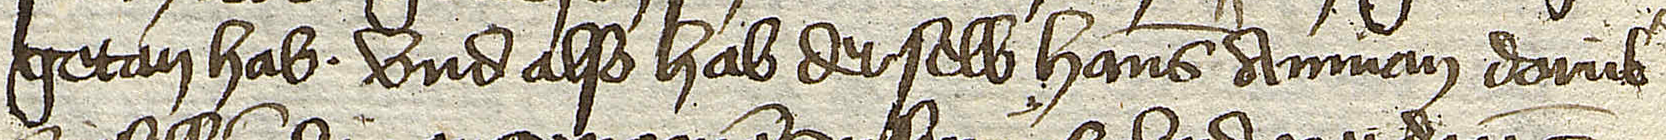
getan hab . vnd alſo hab derſelb hans* Amman darüb*
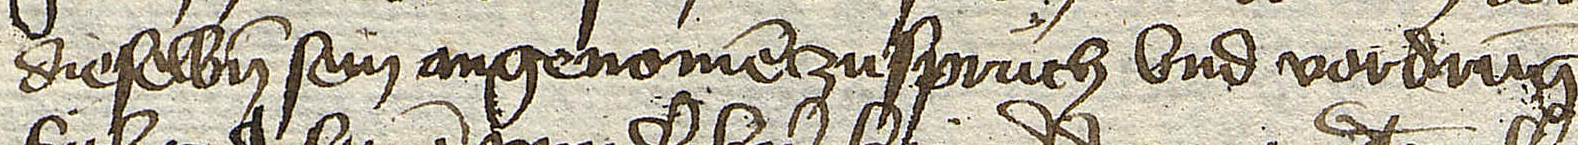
dieſelbn* ſein angenome* cʒuſprüch vnd vordrug*
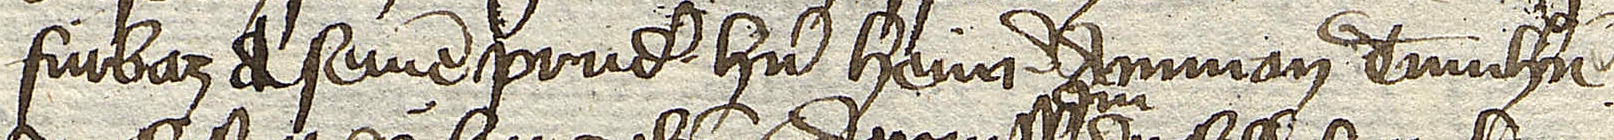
fürbaʒ A ſeine* Prud* hn* heinr* Amman Tumh*re*
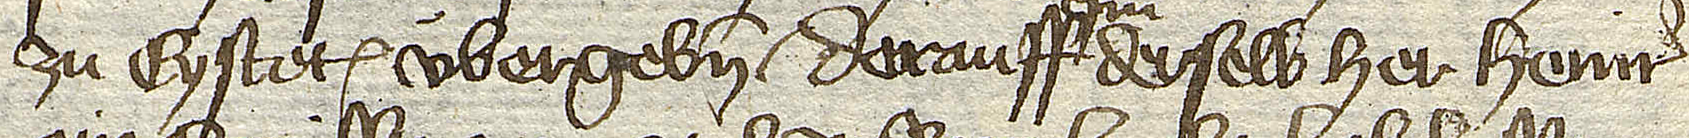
cʒu Eyſtet* v̈bergebn* / darauff derſelb her heinr*
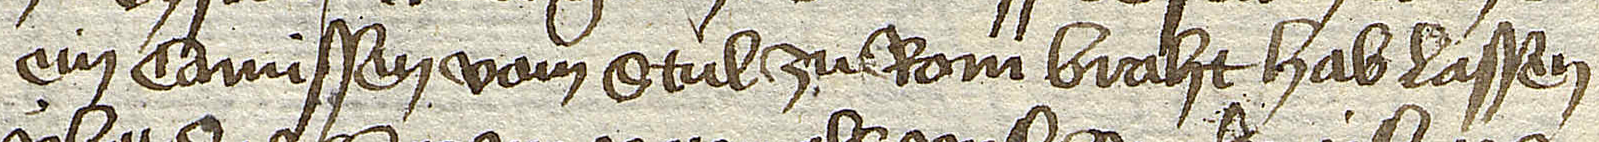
ein Comiſſen vom Stul cʒu Rom braht hab laſſen
